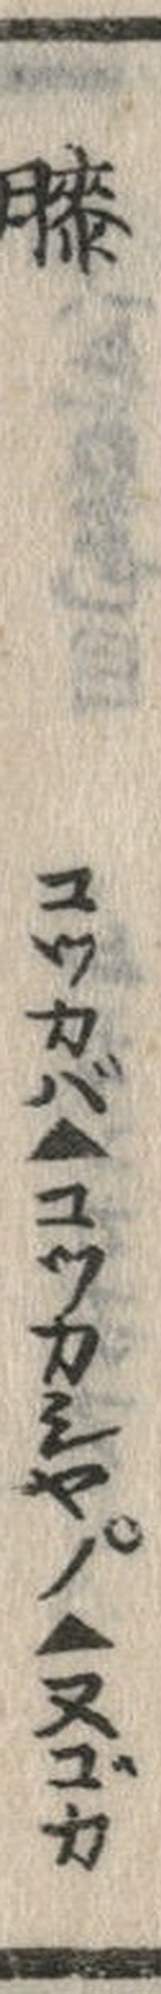膝コツカバ▲コツカシヤノ▲ヌゴカ
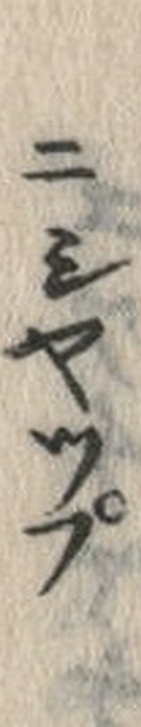ニシヤツプ
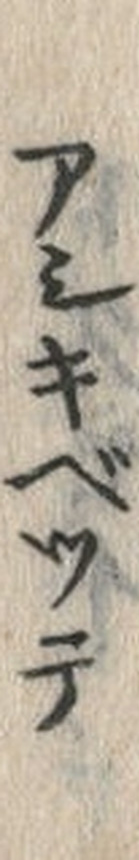指アシキベツテ
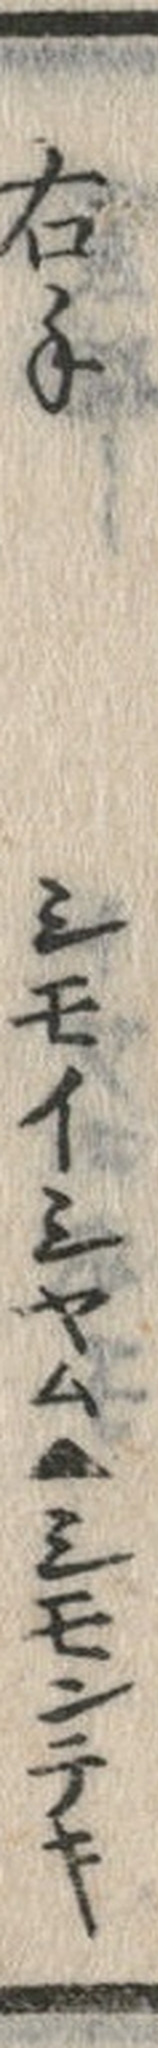右手シモイシヤム▲シモンテキ
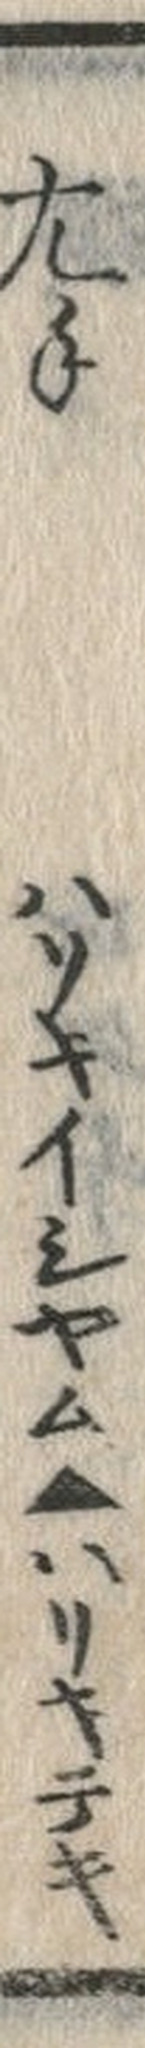左手ハリキイシヤム▲ハリキテキ
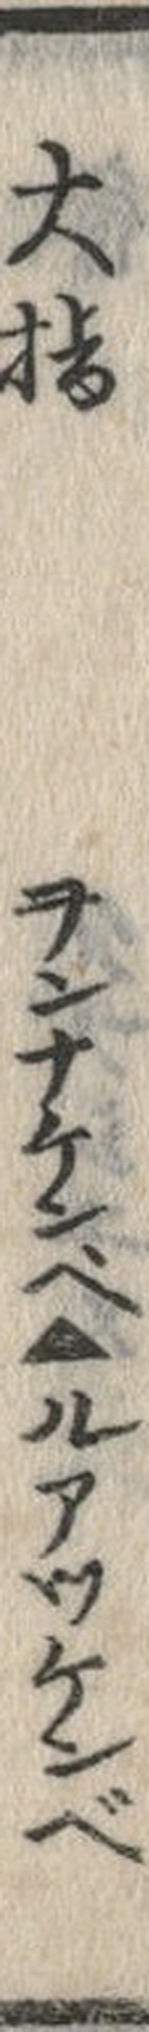大指ヲンナケンベ▲ルアツケンベ
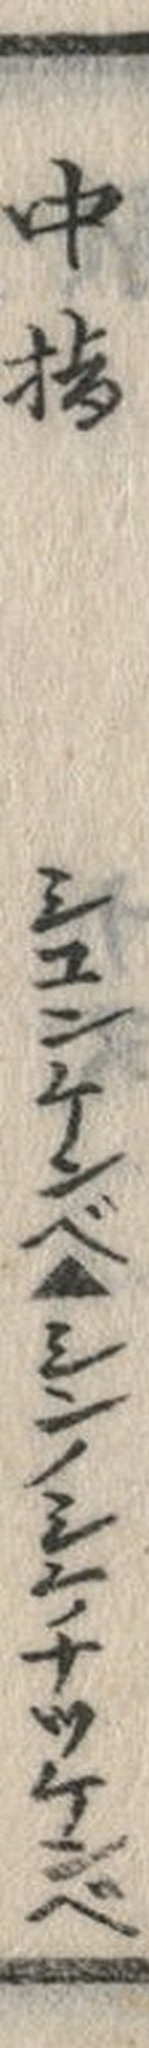中指シユンケンベ▲シンノシケナツケンベ

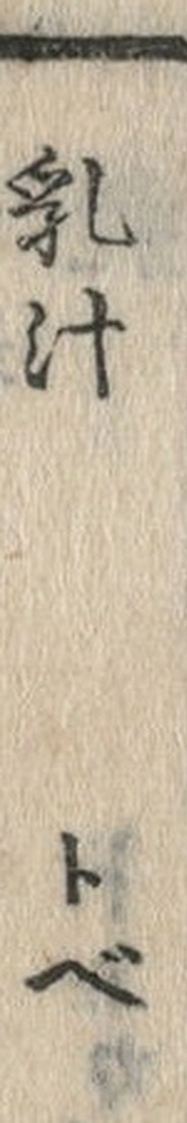乳汁トベ
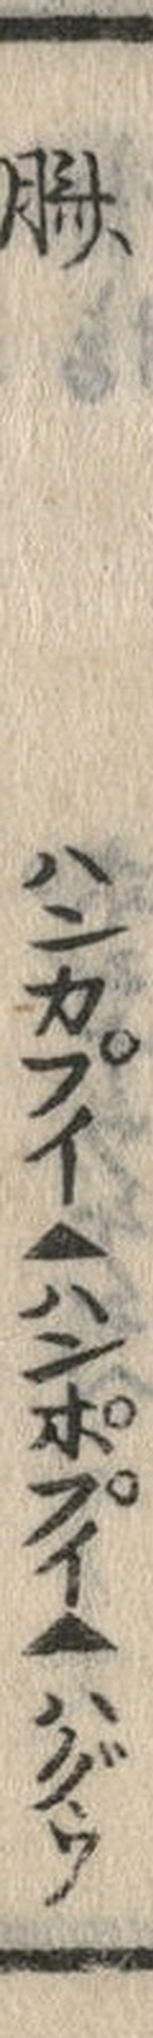臍ハンカプイ▲ハンポプイ▲ハグウ
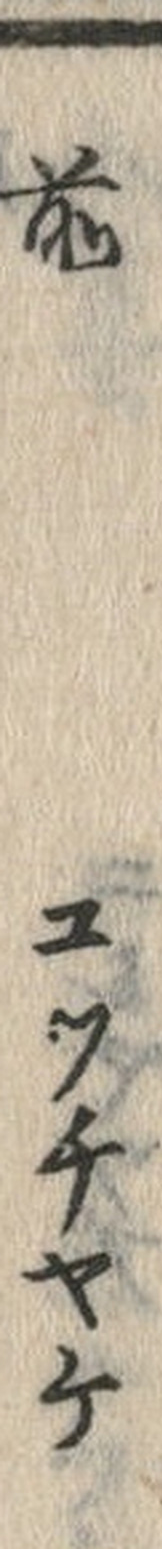前ユツチヤケ
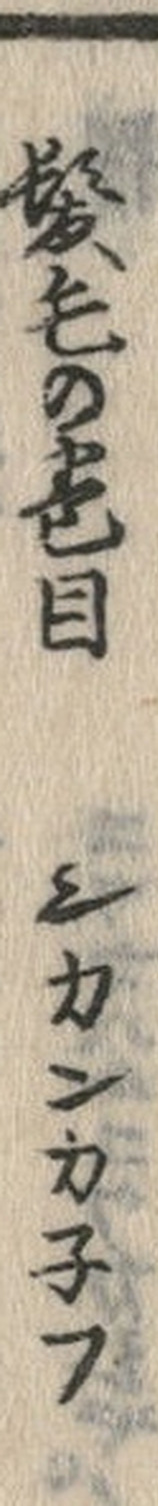髪毛の巻目シカンカネフ
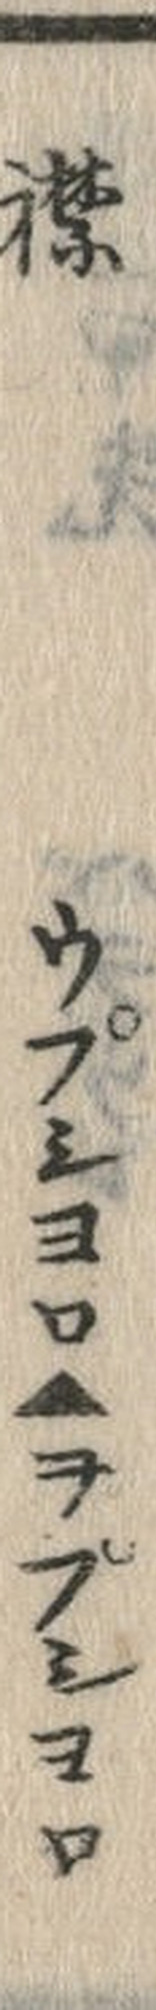襟ウプシヨロ▲ヲプシヨロ
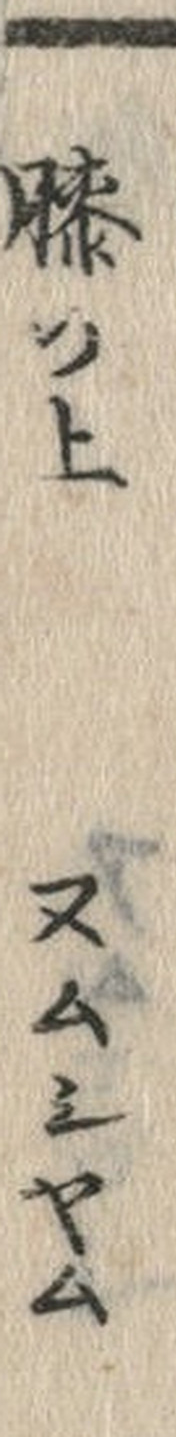膝の上ヌムシヤム

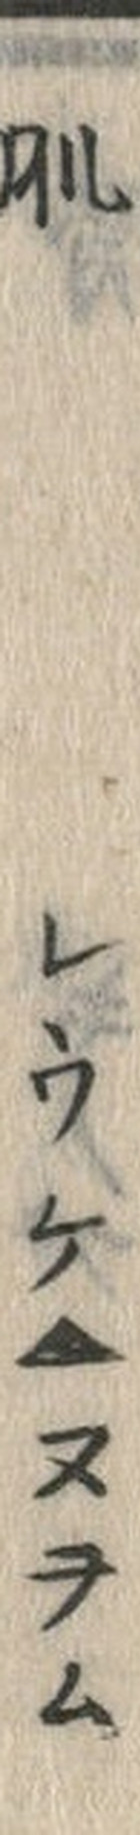肌レウケ▲ヌヲム
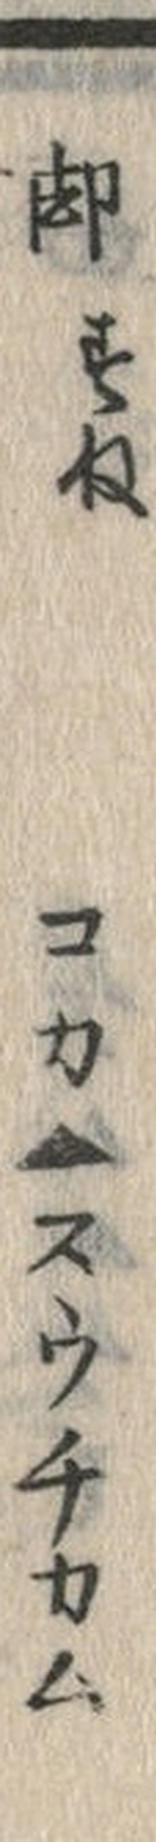脚すねコカ▲スウチカム
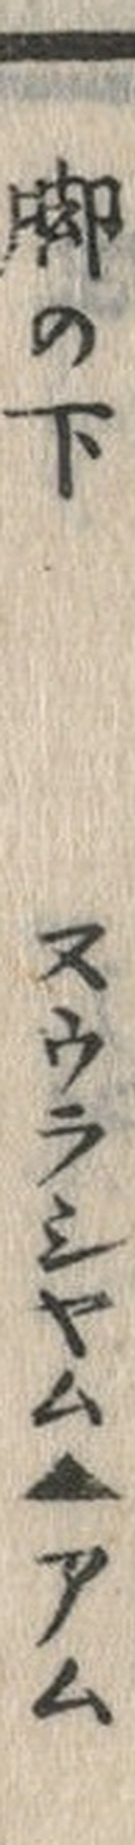脚の下ヌウラシヤム▲アム
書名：蝦夷方言藻汐草　乾巻
